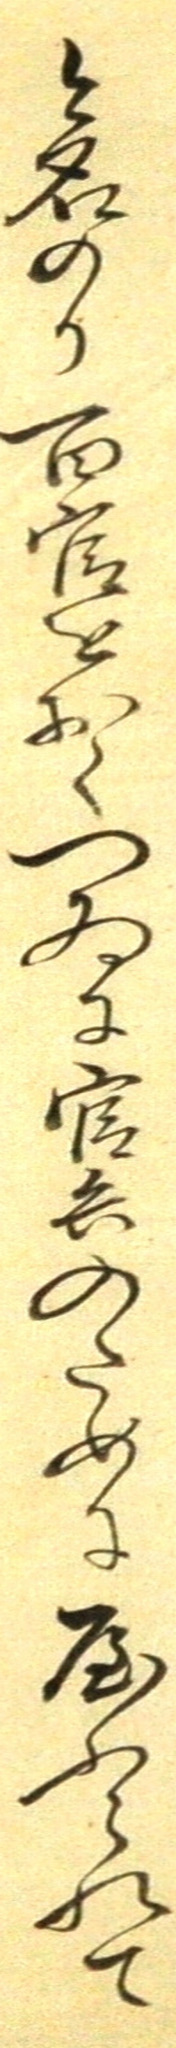と名のり百官をおくつゐに官兵のためにやふられて
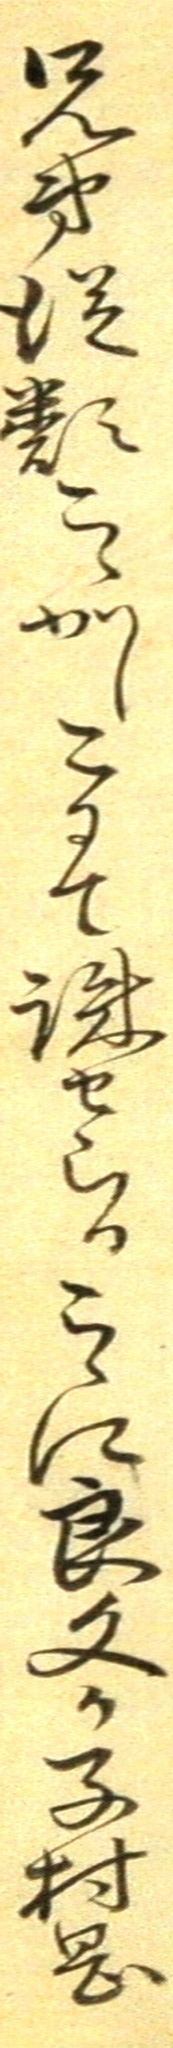兄弟従類こゝかしこにて誅せらるこゝに良文か子村岡

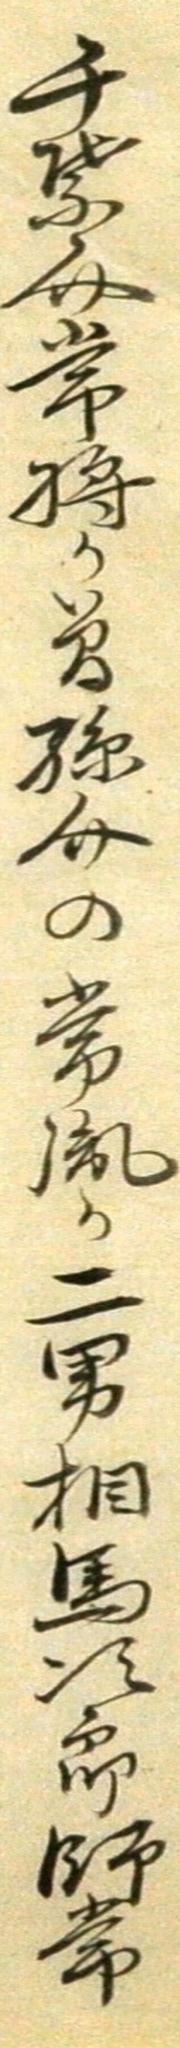千葉介常将か曽孫介の常胤か二男相馬次郎師常
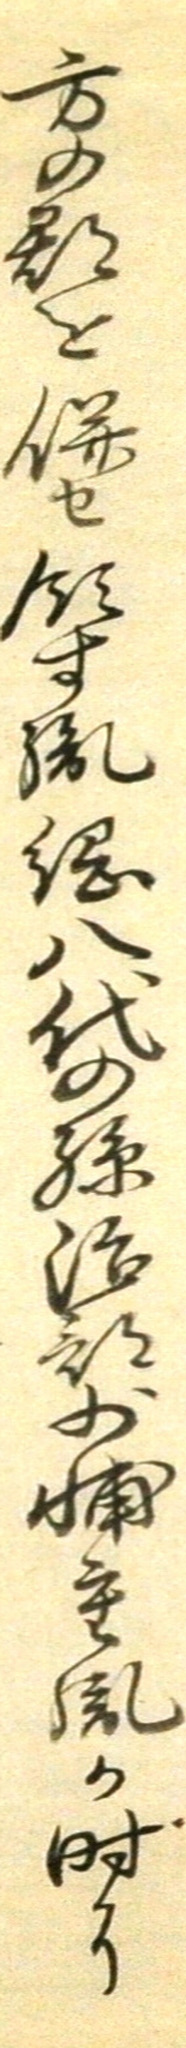方の郡を併せ領す胤綱八代の孫治部少輔か時に
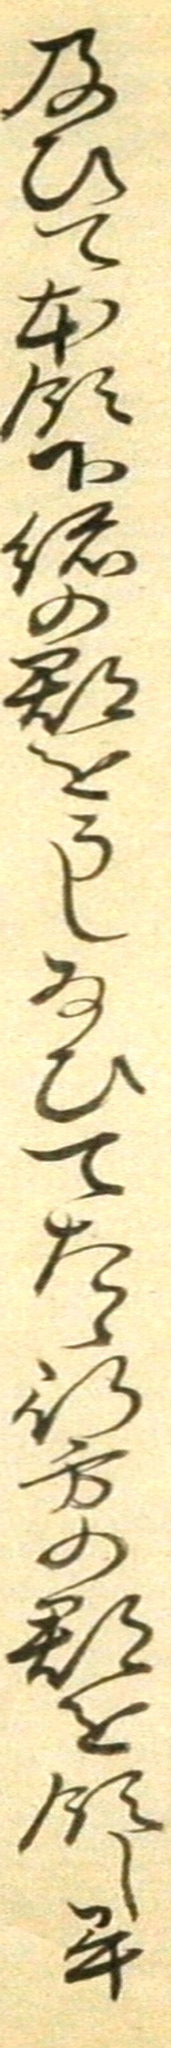及ひて本領下総の郡をうしなひてたゝ行方の郡を領し畢
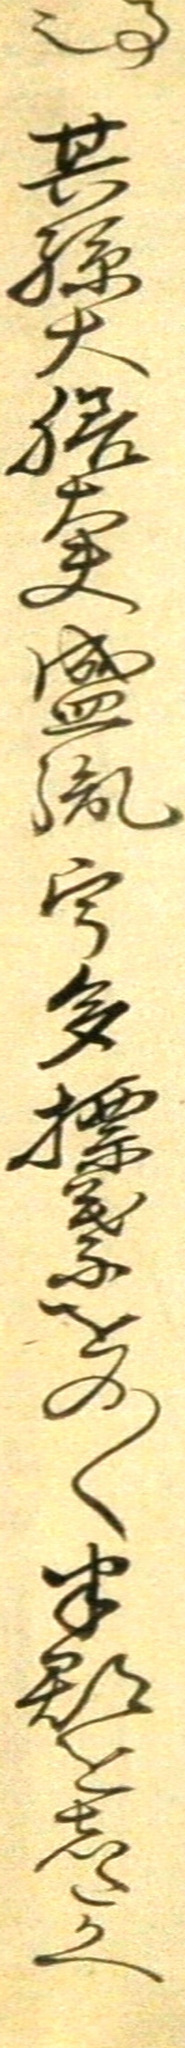事也其孫大膳大夫盛胤宇多標葉をの〳〵半郡をしたかへ

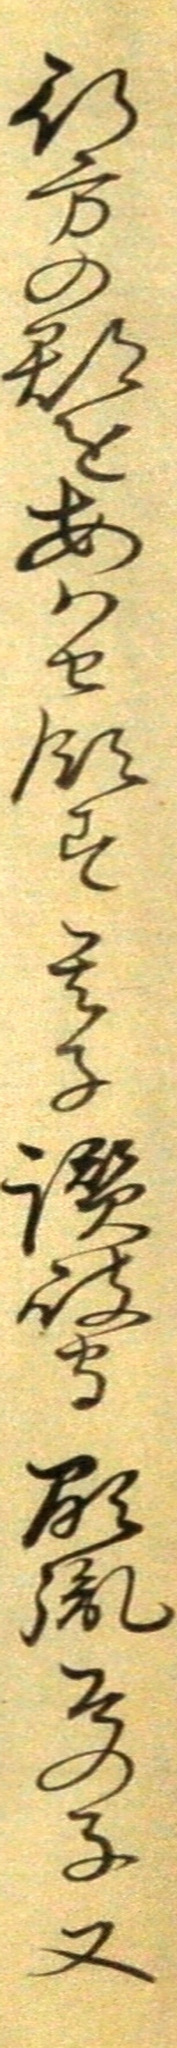行方の郡をあはせ領す其子讃岐守顕胤その子又
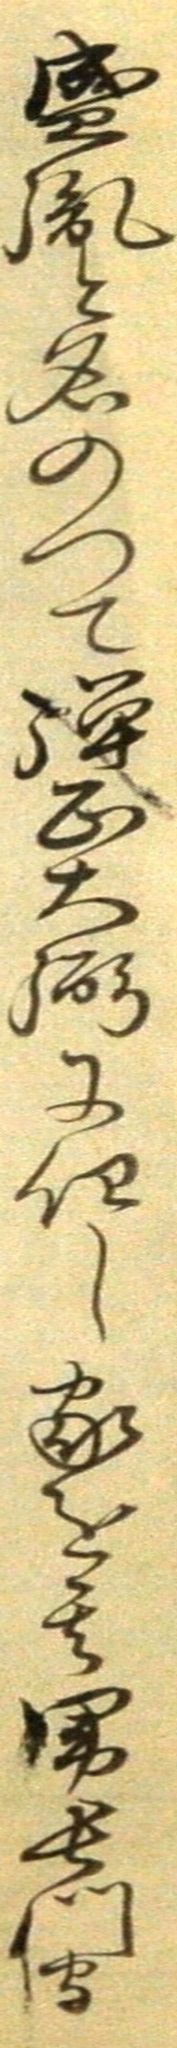盛胤と名のつて弾正大弼に任し家を其男長門守
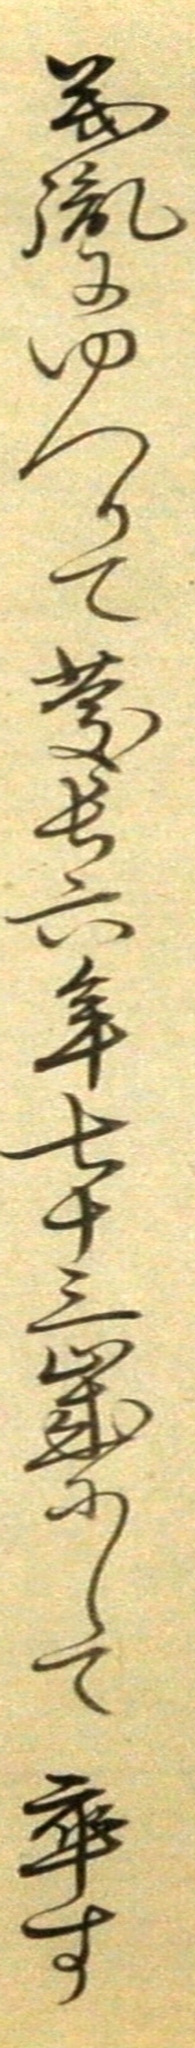義胤にゆつりて慶長六年七十三歳にして卒す
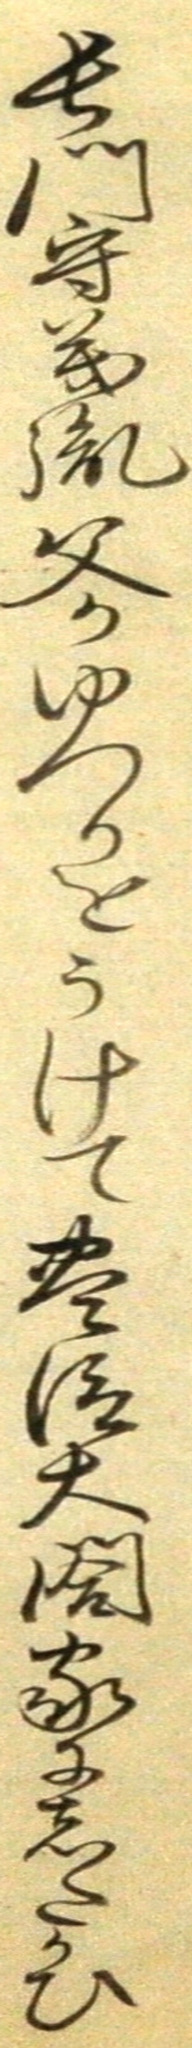長門守義胤父かゆつりをうけて豊臣太閤家にしたかひ
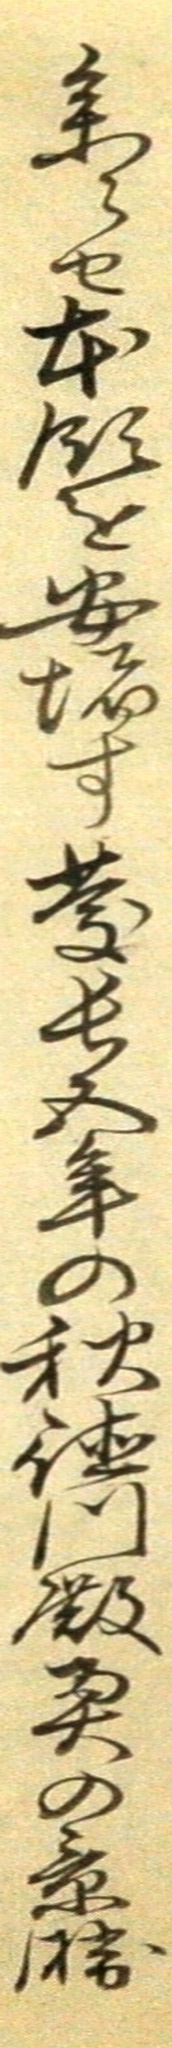参らせ本領を安堵す慶長五年の秋徳川殿奥の景勝
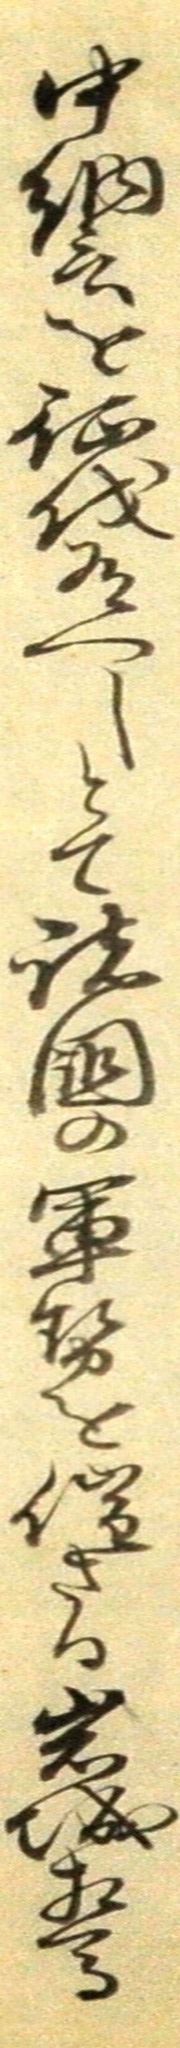中納言を征伐すへしとて諸国の軍勢を催さる岩城相馬
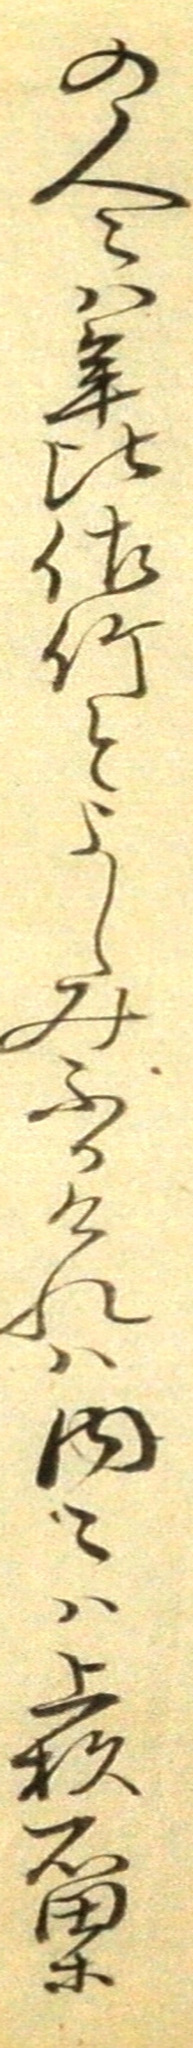の人々は年比佐竹とよしみふかけれは内々は上杉石田等
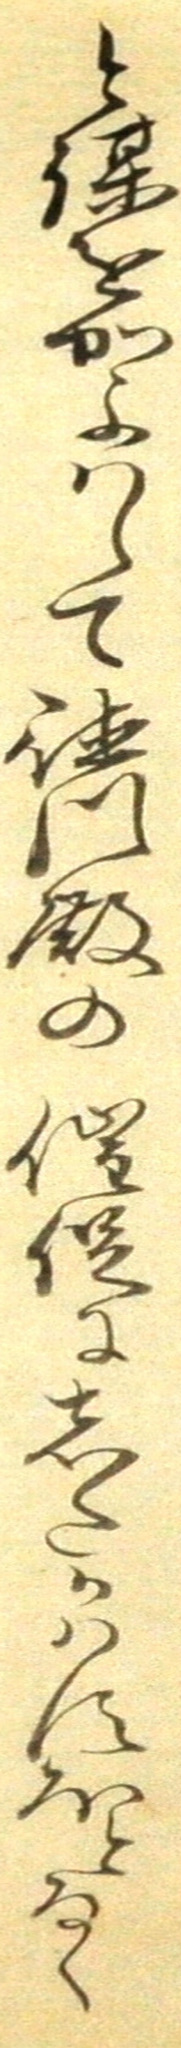と謀をかよはして徳川殿の催促にしたかはすほとなく
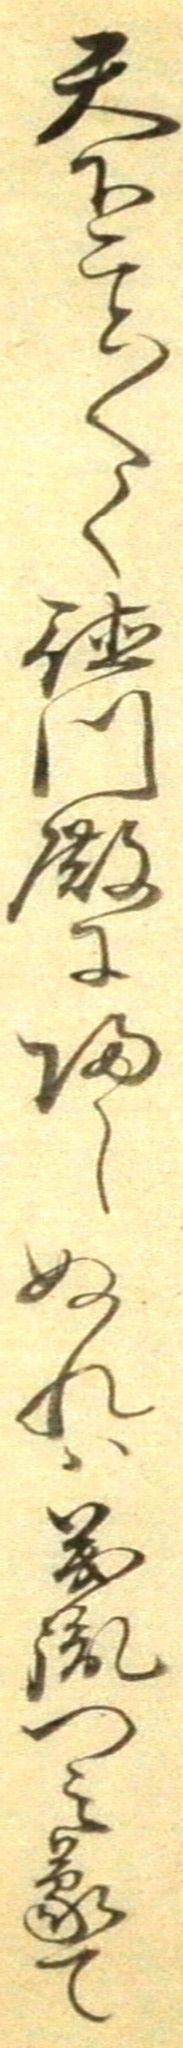天下こと〳〵く徳川殿に帰しぬれは義胤つみ蒙て
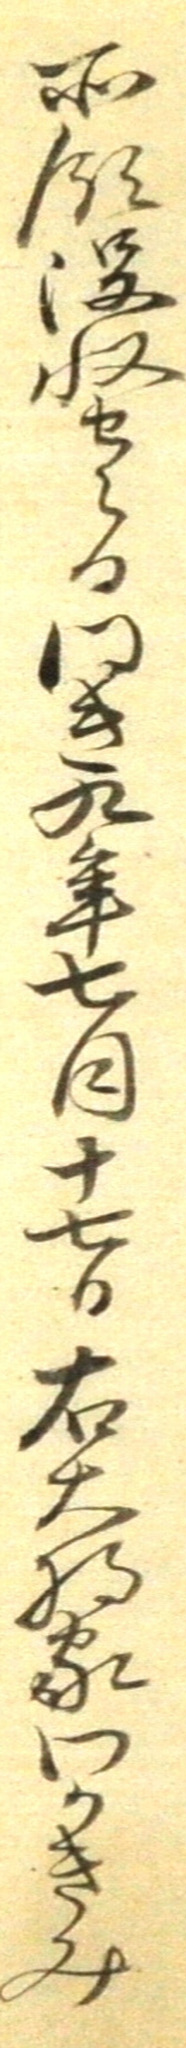所領没収せらる同き九年七月十七日右大将家わかきみ
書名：藩翰譜（八・下）
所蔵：伊那市立高遠町図書館・合同会社AMANE
